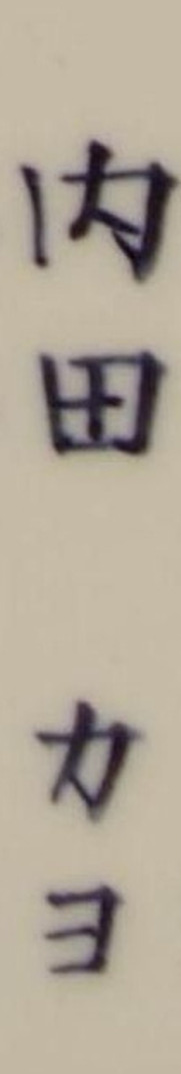内田カヨ
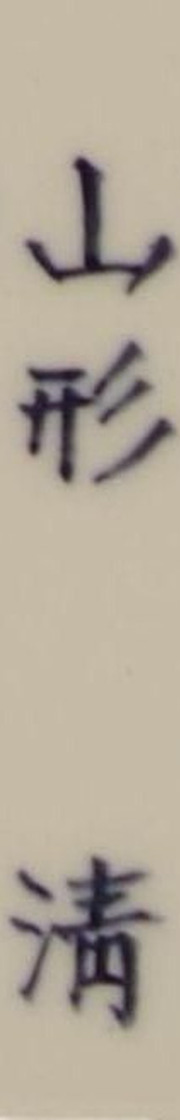山形清
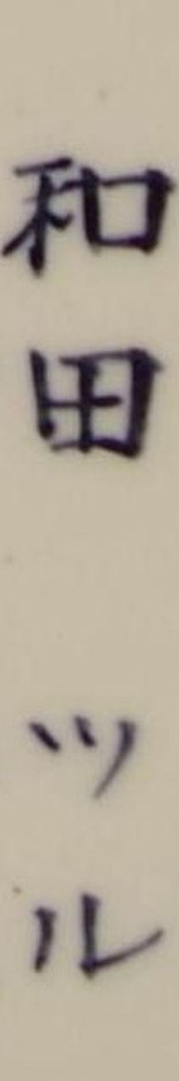和田ツル
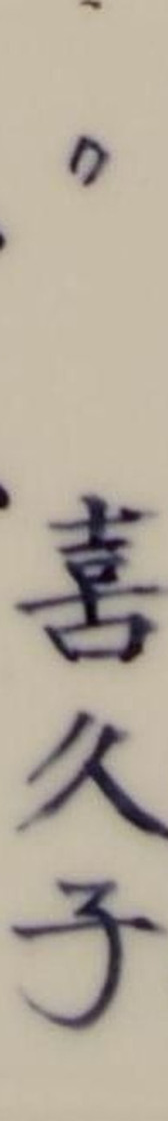喜久子
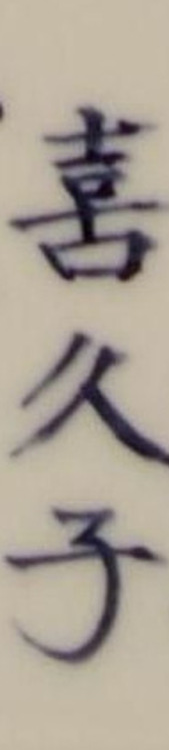喜久子
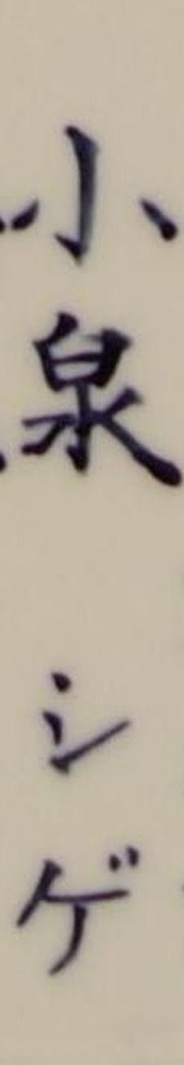小泉シゲ
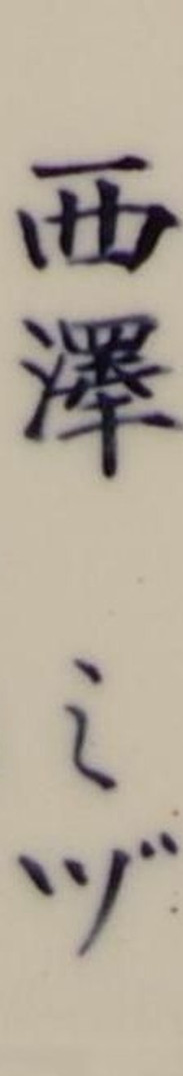西澤ミヅ
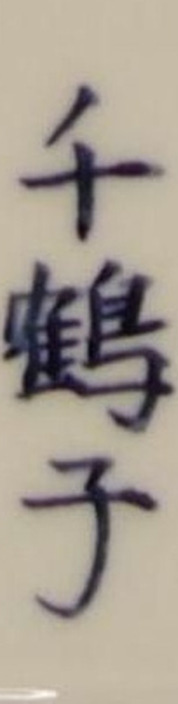千鶴子
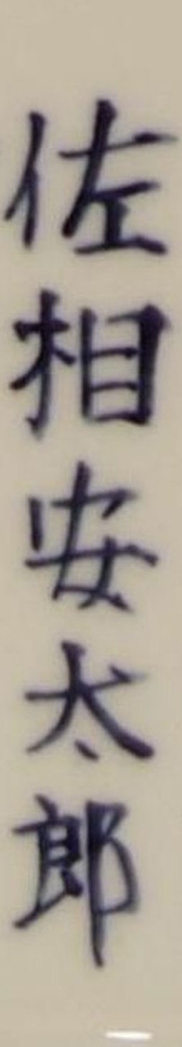佐相安太郎
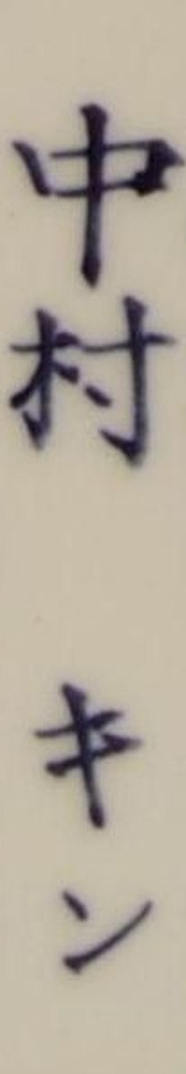中村キン
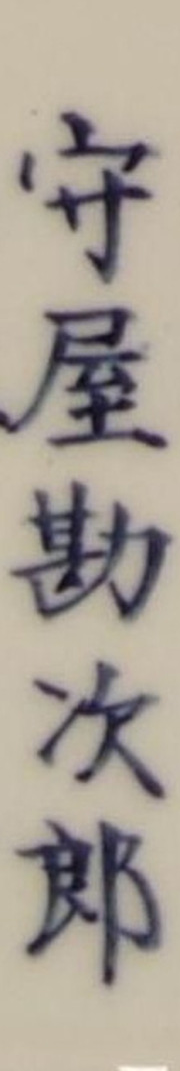守屋勘次郎
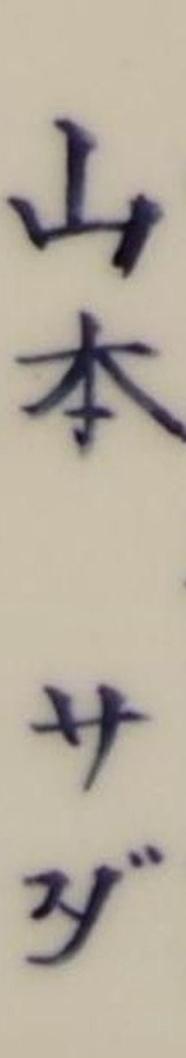山本サダ
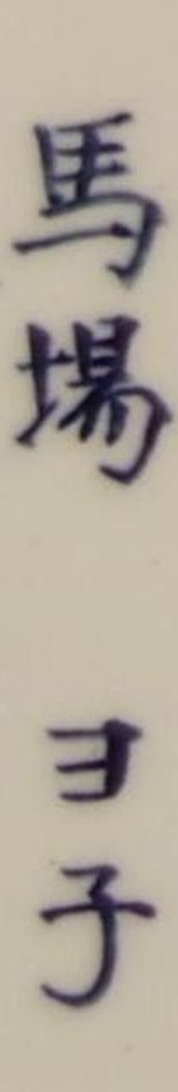馬場ヨ子

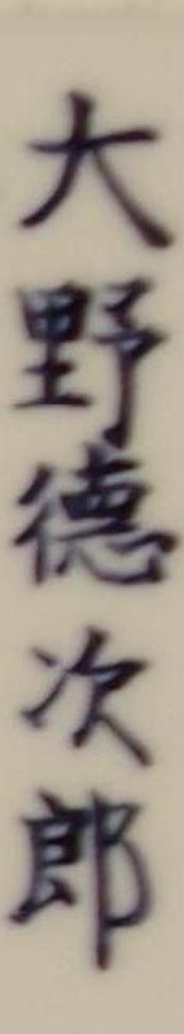大野徳次郎
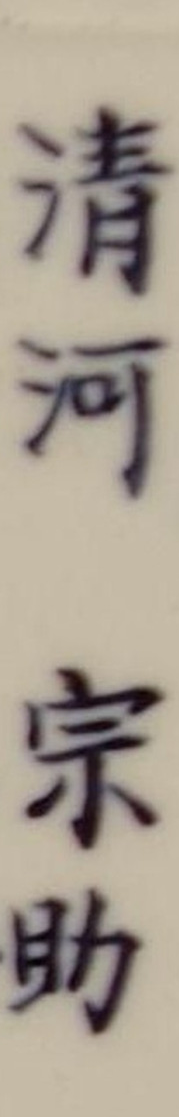清河宗助
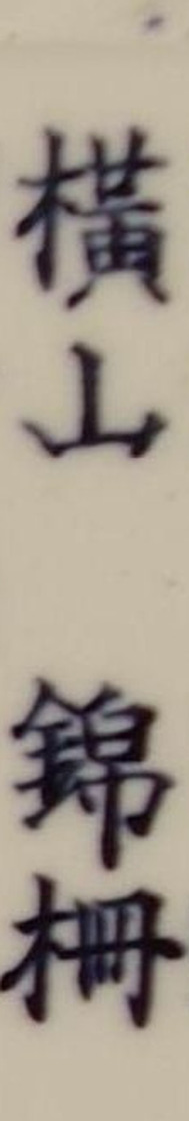横山錦柵
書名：M~S
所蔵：高野山金剛峯寺
